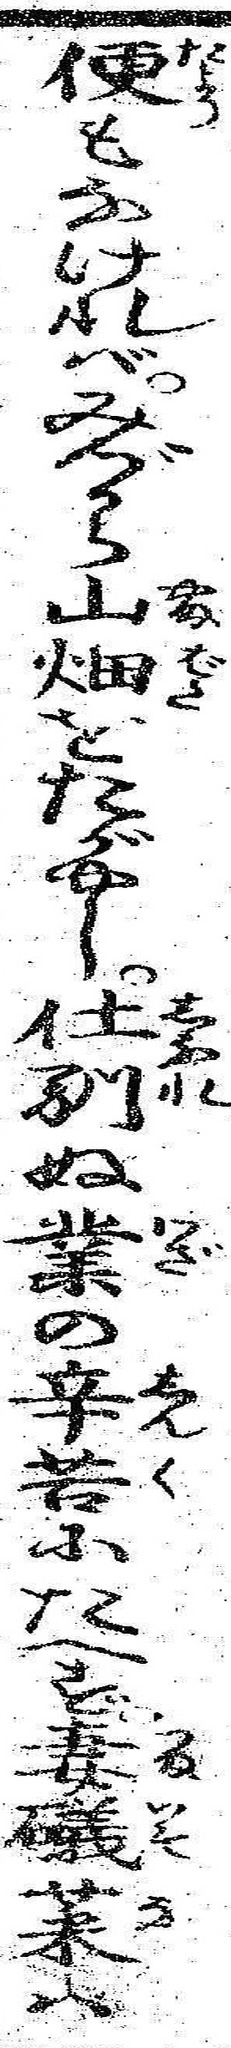便もなければ。みづから山畑をたがやし。仕馴ぬ業の辛苦にたへず。妻礒菜は
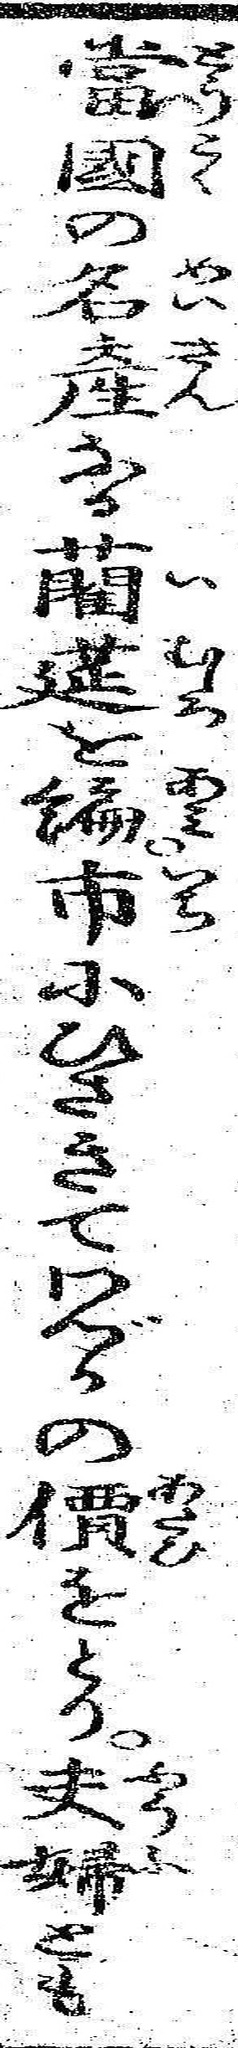当国の名産なる藺莚を編。市にひさきてわづかの価をとり。夫婦とも
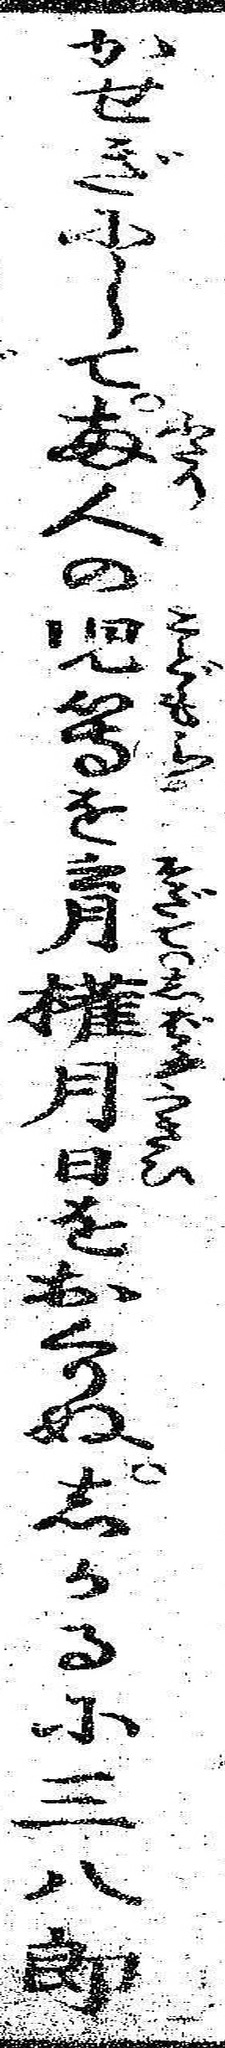かせぎにして。両人の児等を育。権月日をおくりぬ。しかるに三八郎
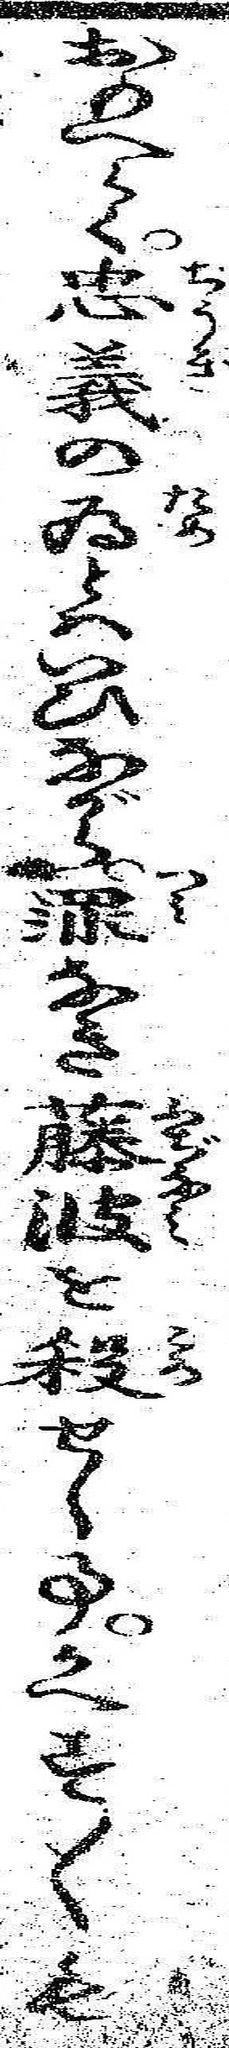おもへらく。忠義の為とはいひながら。罪なき藤波を殺せし事。かへす〳〵も
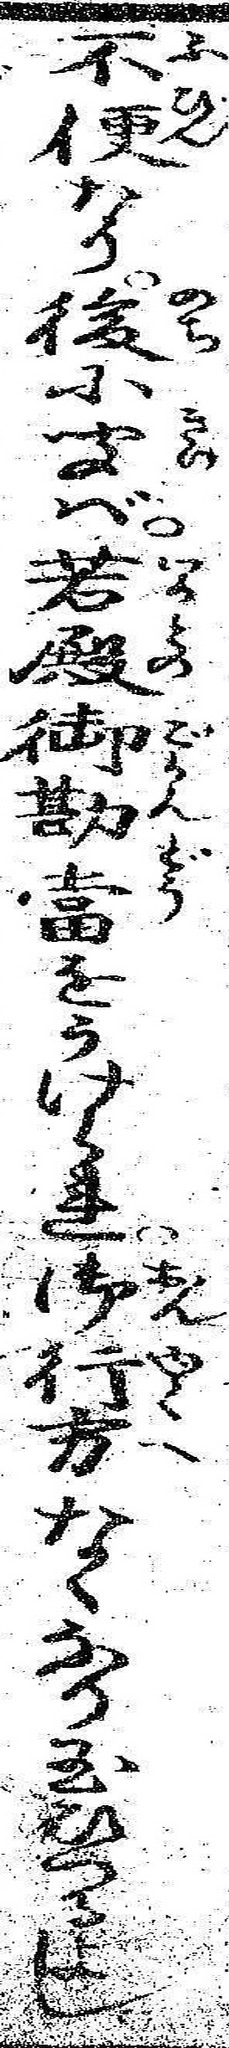不便なり。後に聞ば。若殿御勘当をうけられ。御行方なくなり玉ひつるよし。
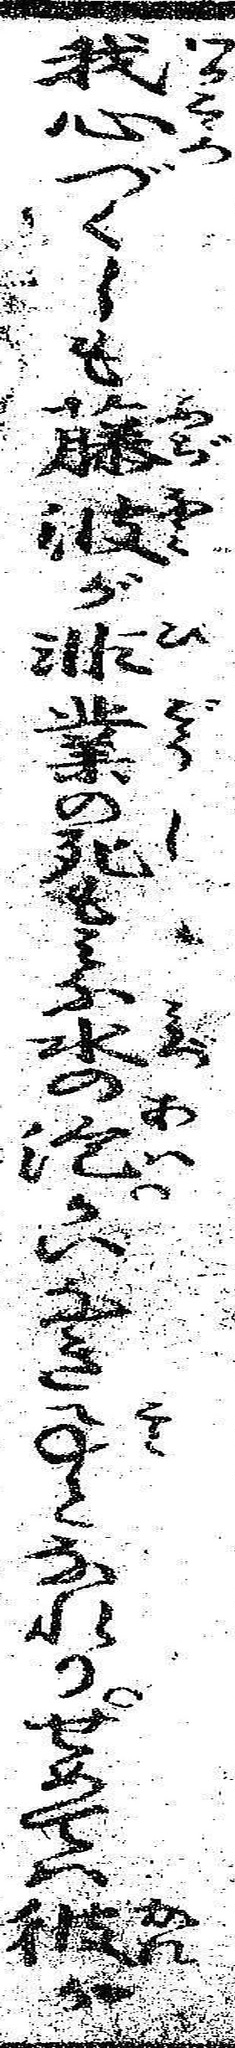我心づくしも藤波が非業の死もみな水の泡。かいなき事となれり。せめては彼が

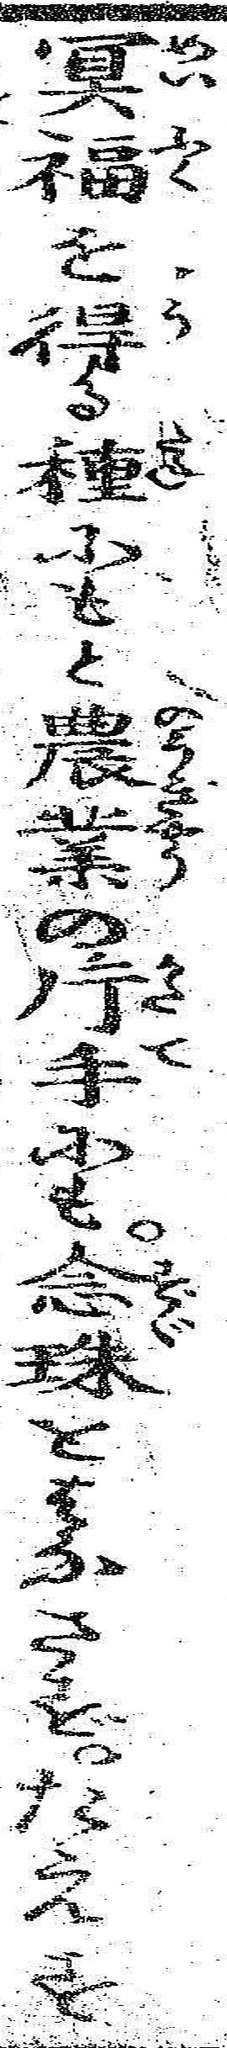冥福を得る種にもと農業の片手にも。念珠をはなさず。たえす
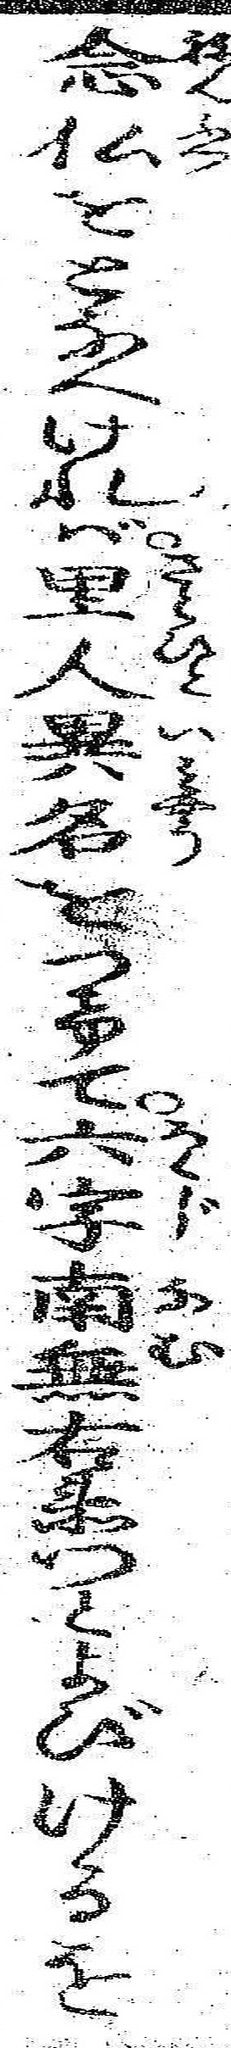念仏をとなへければ。里人異名をつけて。六字南無右衛門とよびけるを
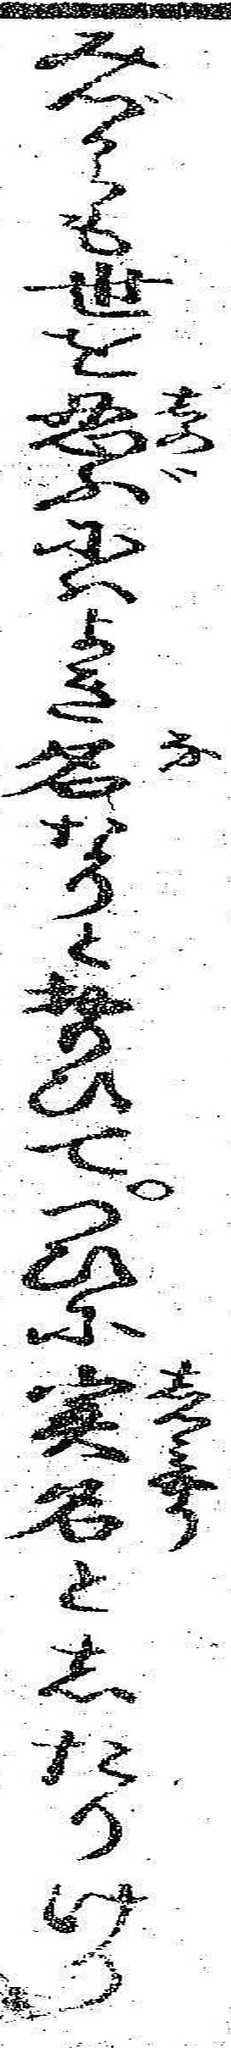みづからも世を忍ぶにはよき名なりとおもひて。つひに実名としたりけり
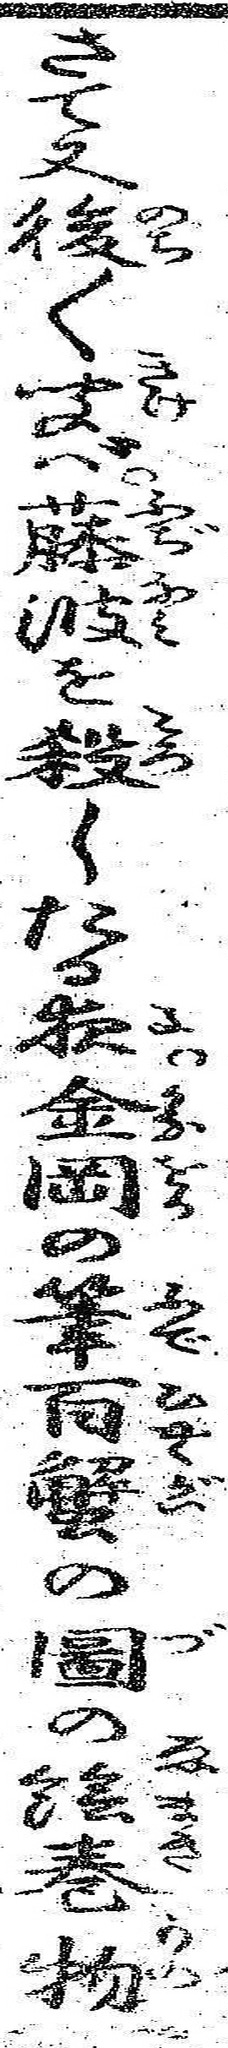さて又後々聞ば。藤波を殺したる夜。金岡の筆百蟹の図の絵巻物
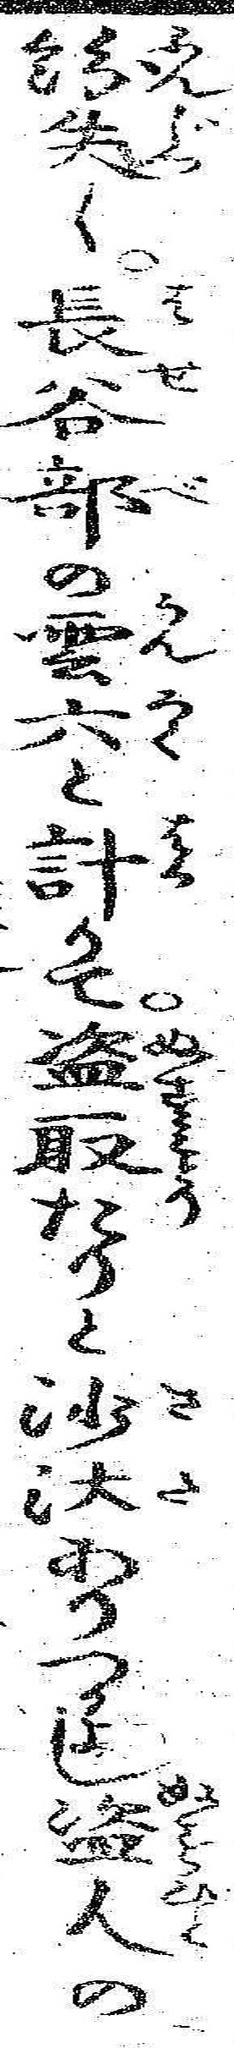紛失し。長谷部の雲六と計りて。盗取たりと沙汰ありつるよし盗人の
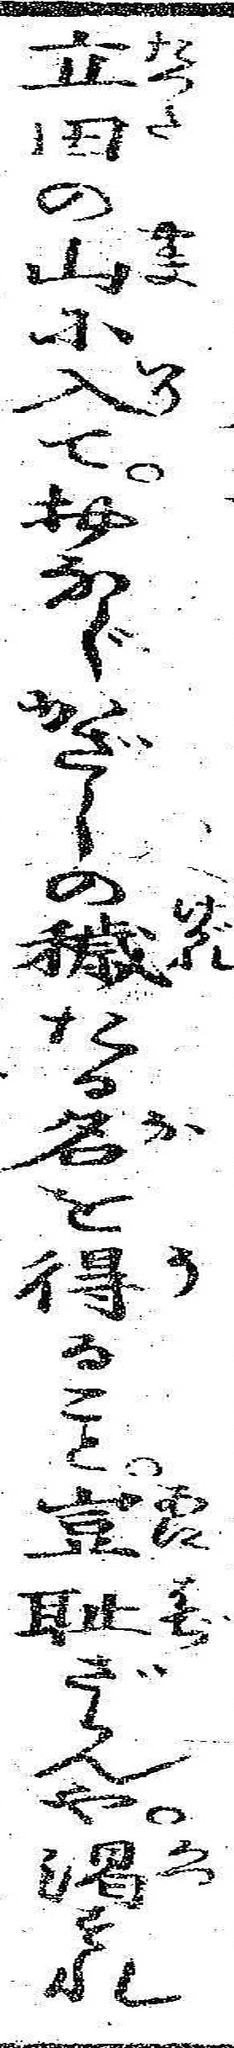立田の山に入て。おなじかざしの穢たる名を得ること。豈恥ざらんや。渇すれ
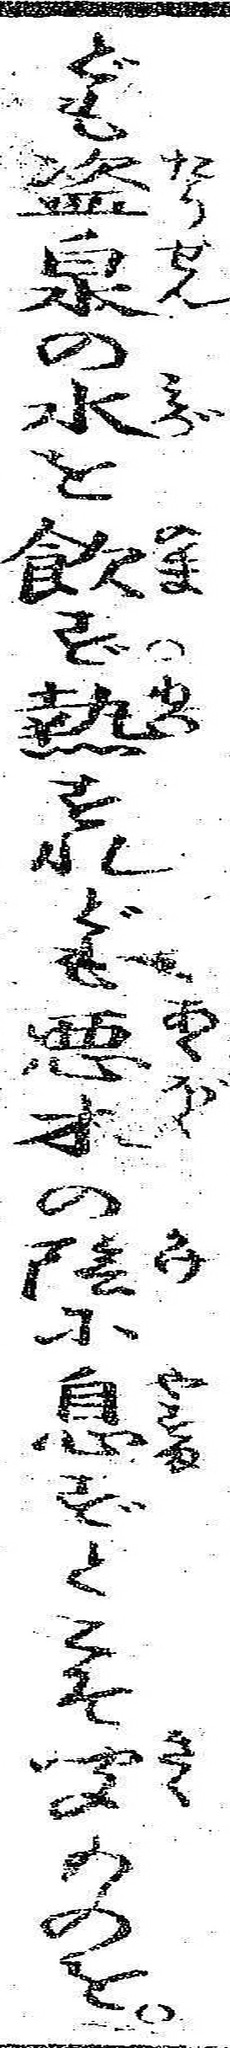ども盗泉の水を飲ず。熱すれども悪木の陰に息ずとこそ聞ものを。
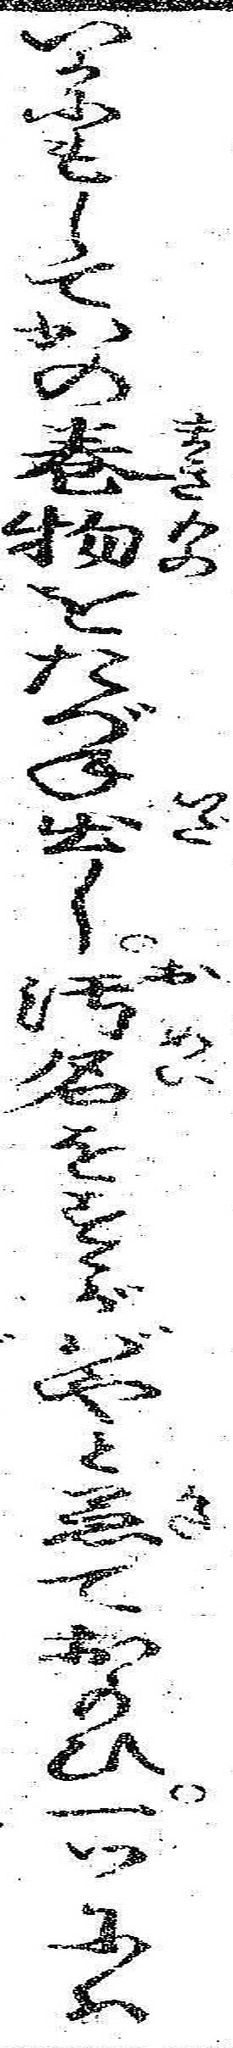いかにもしてかの巻物をたづね出し。汚名をすゝがばやと兼ておもひ。一ツには
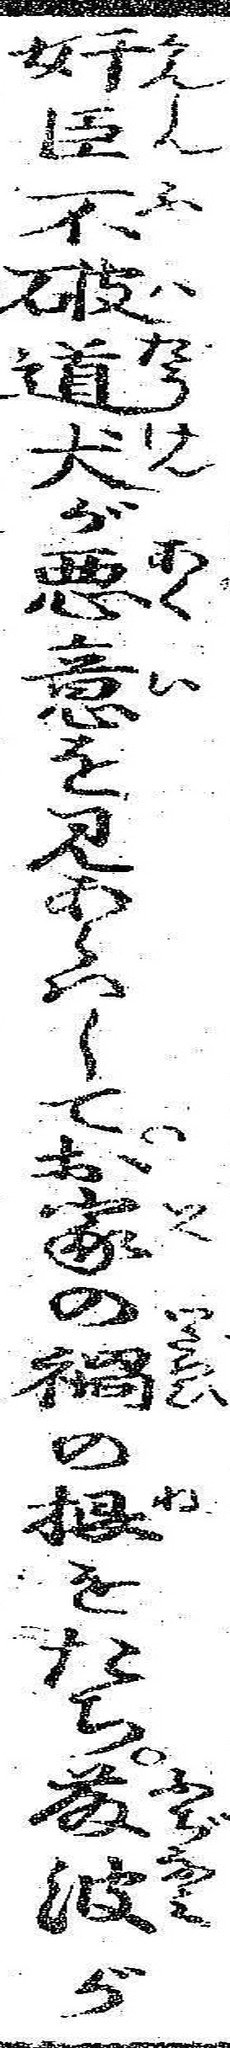奸臣不破道犬が悪意を見あらはして。お家の禍の根をたち。藤波が
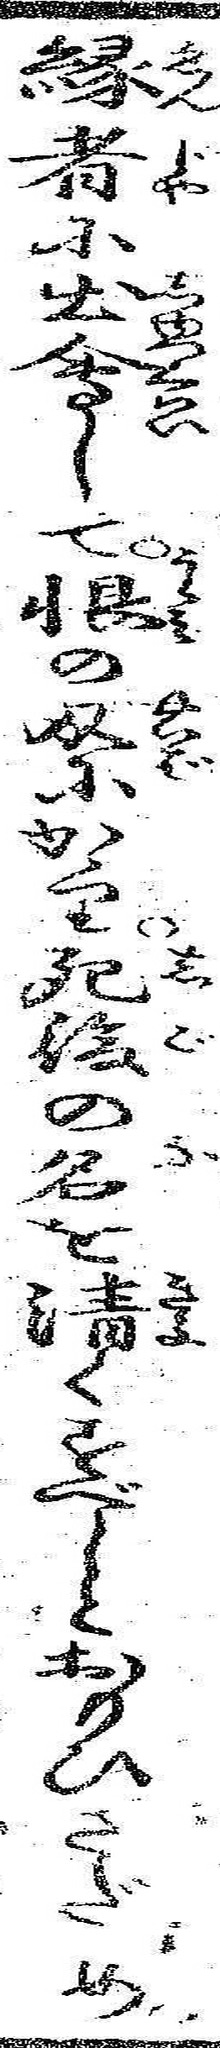縁者に出会して。恨の刃にかゝり。死後の名を清くすべしとおもひさだめ。
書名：昔話稲妻表紙
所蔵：国文学研究資料館
